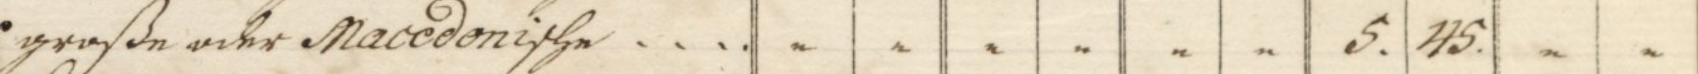große oder Macedonische... 5. 45.
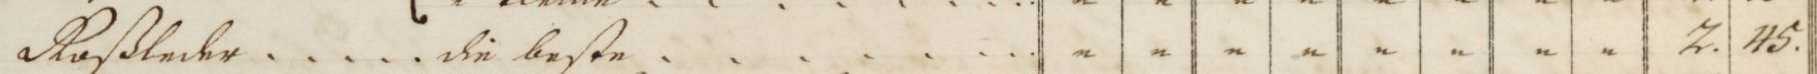Roßleder... die beste... 2. 45.
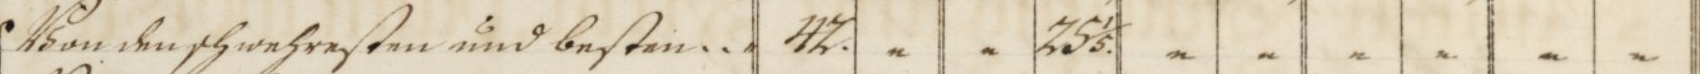Von den schwehresten und besten... 42. 25 1/5.
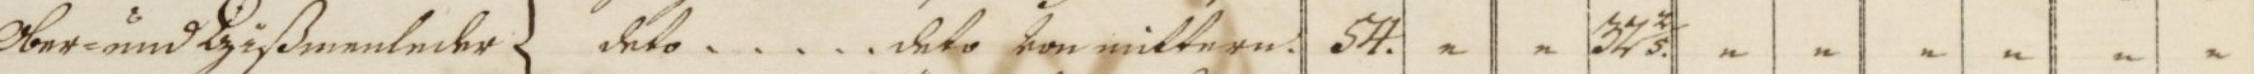Ober- und Czißmenleder deto..... deto von mittern. 54. 32 2/5.
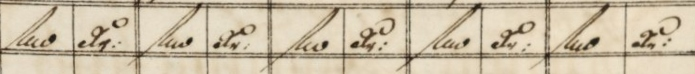flo. Xr. flo. Xr. flo. Xr. flo. Xr. flo. Xr.
